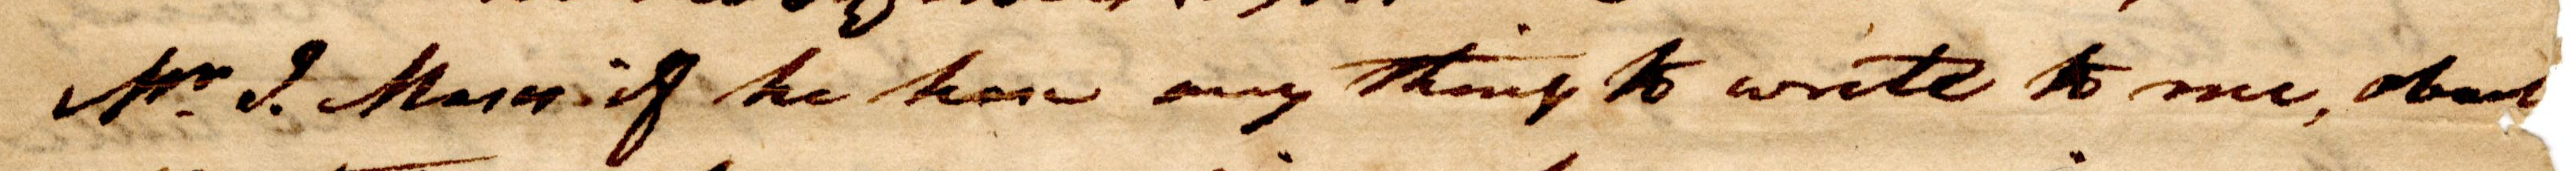M^r I. Moses if he have any thing to write to me, about
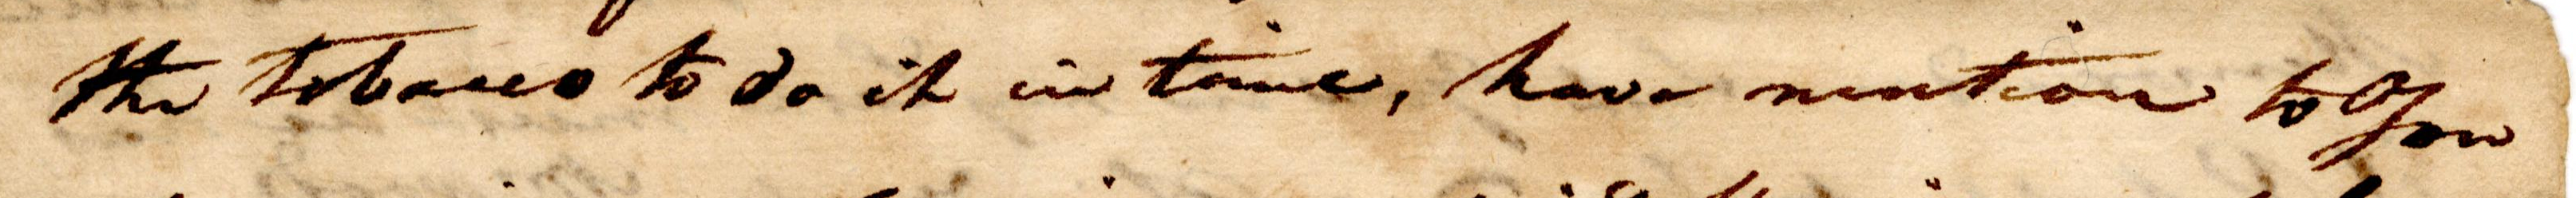the tobacco to do it in time, have mention to you
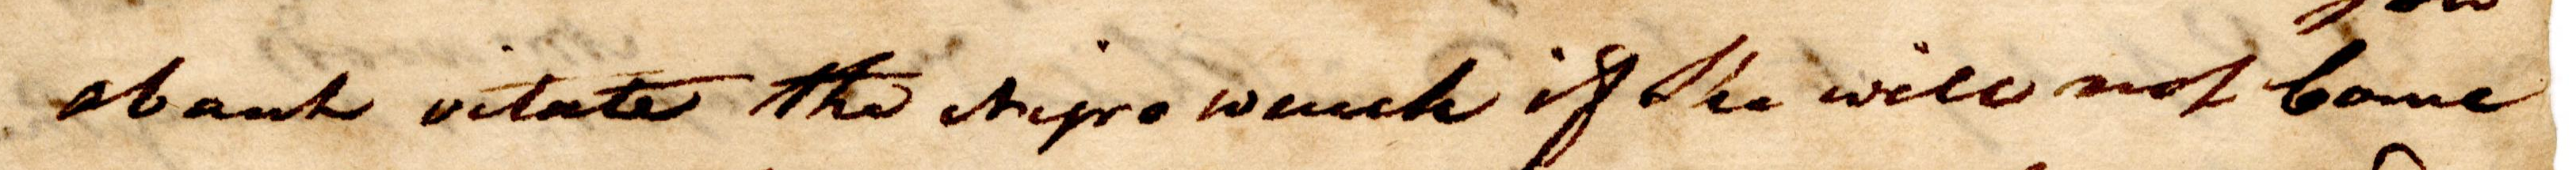about vitate the Negro wench if she will not Come
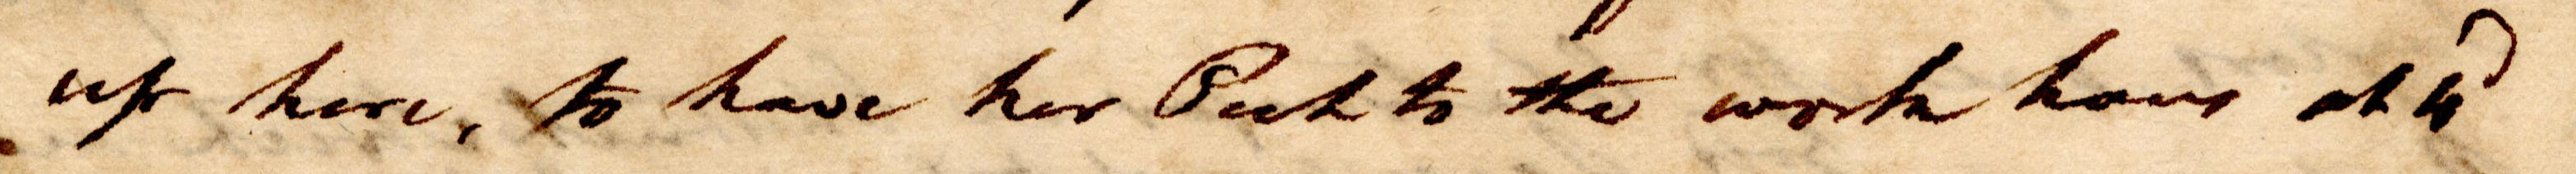up here, to have her Put to the work hows at 4^d
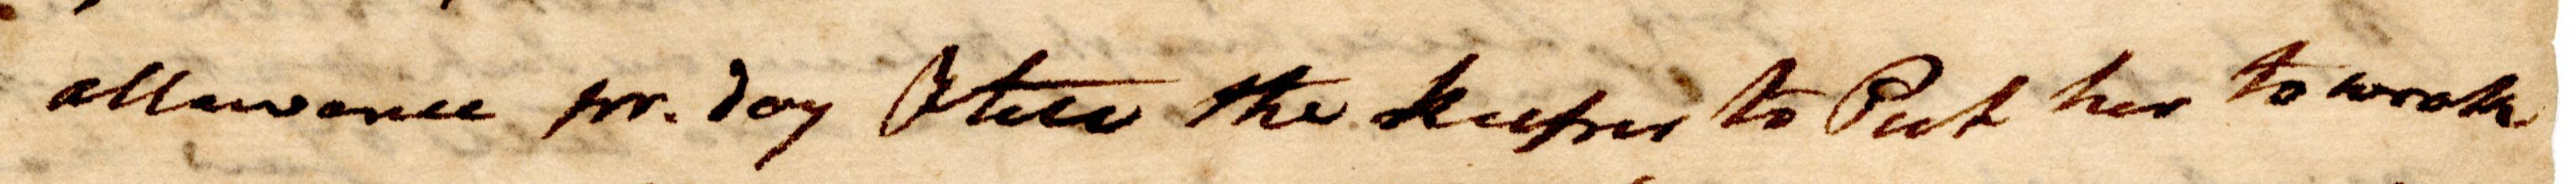allowance per day & take the keeper to Put her to work
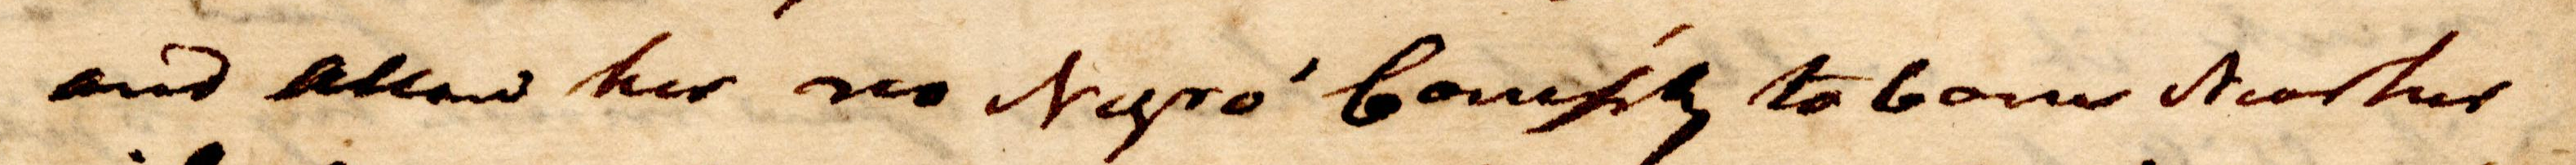and allow her no Negro Comp'y to come Near her
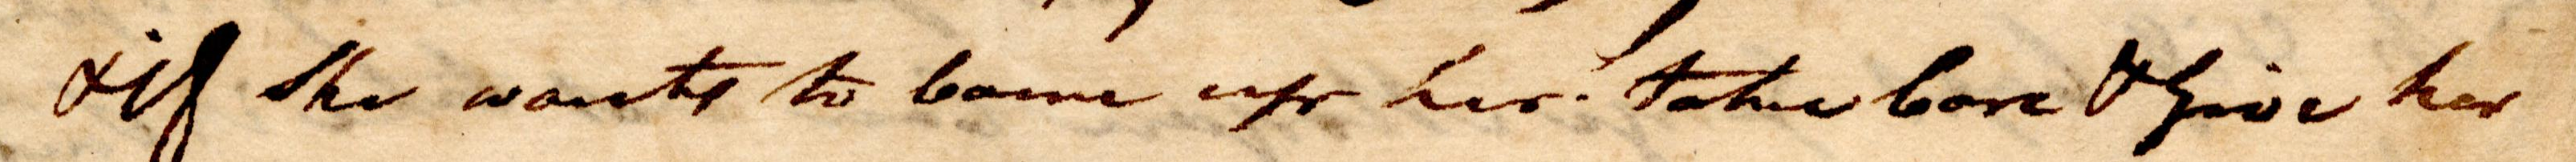& if she wants to come up her take care & Give her
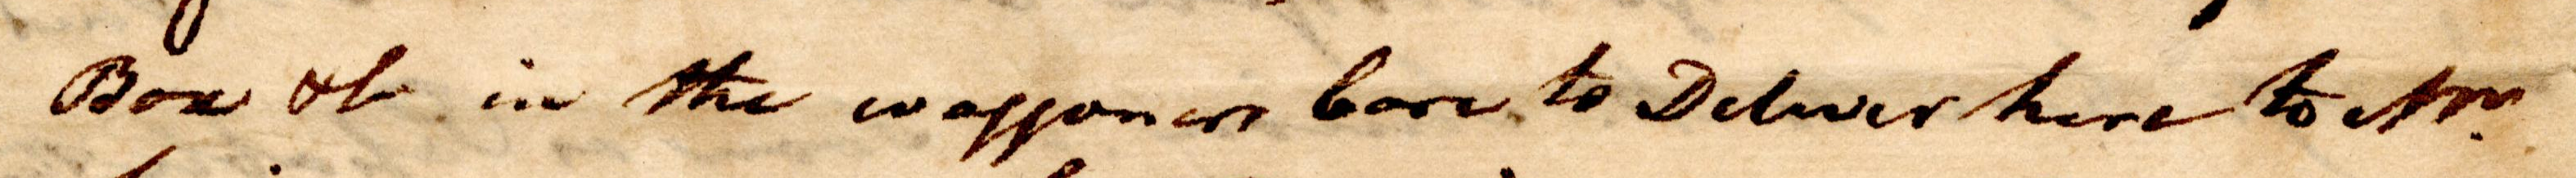Box &C in the waggoners care to Dilever here to M^r.
